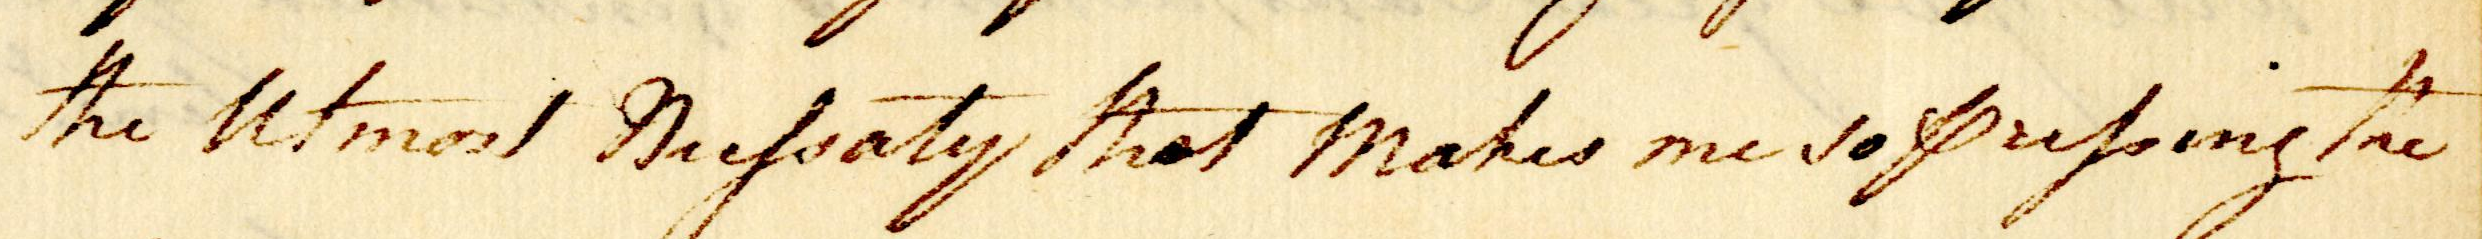the Utmost necessaty that Makes me so pushing the
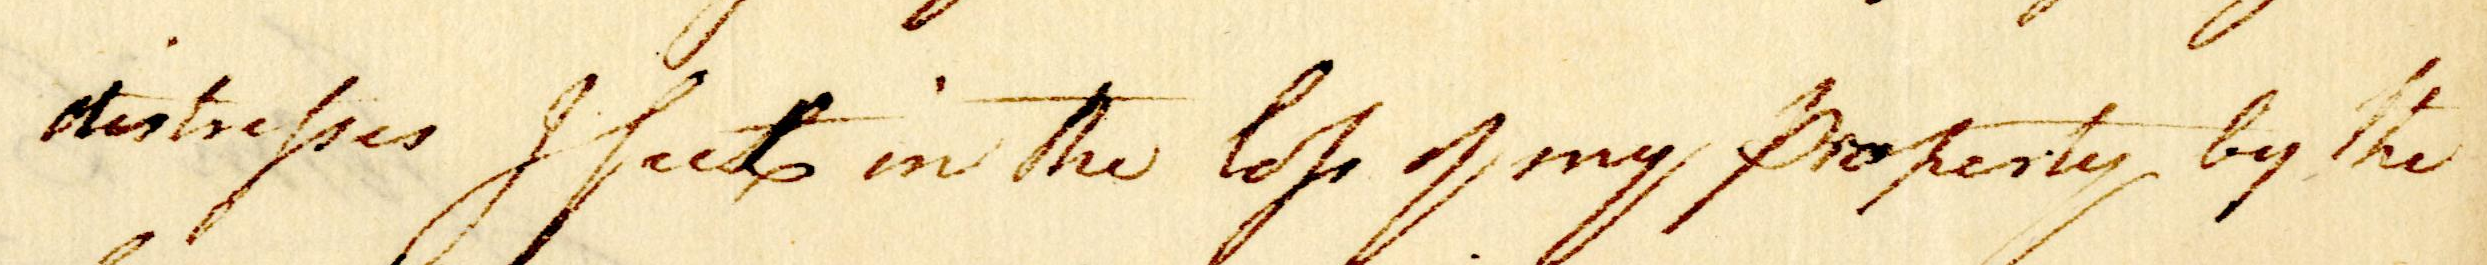distresses I feel in the loss of my Property by the
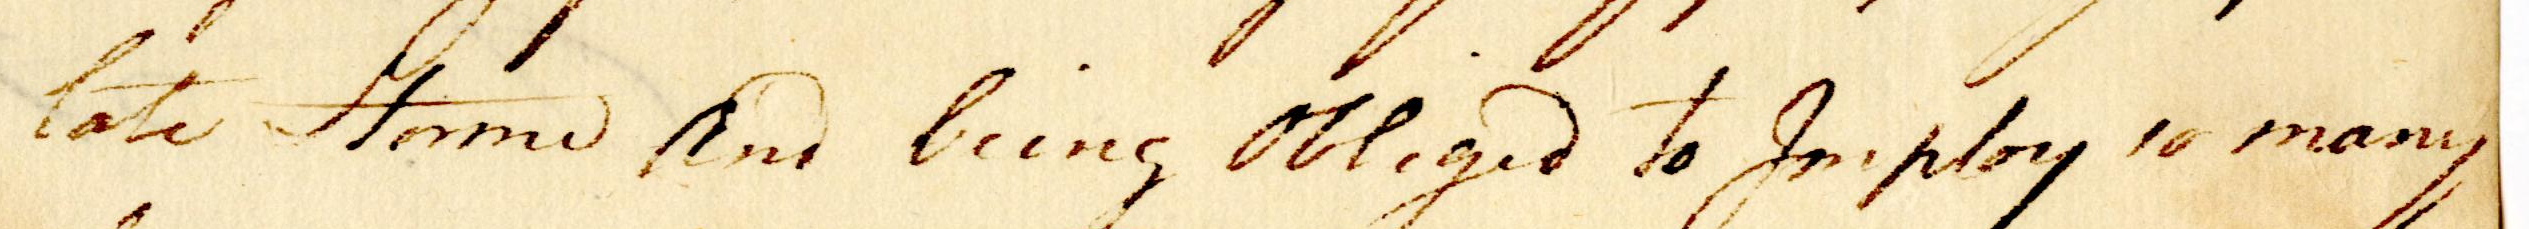late Storme and being obliged to Imploy so many
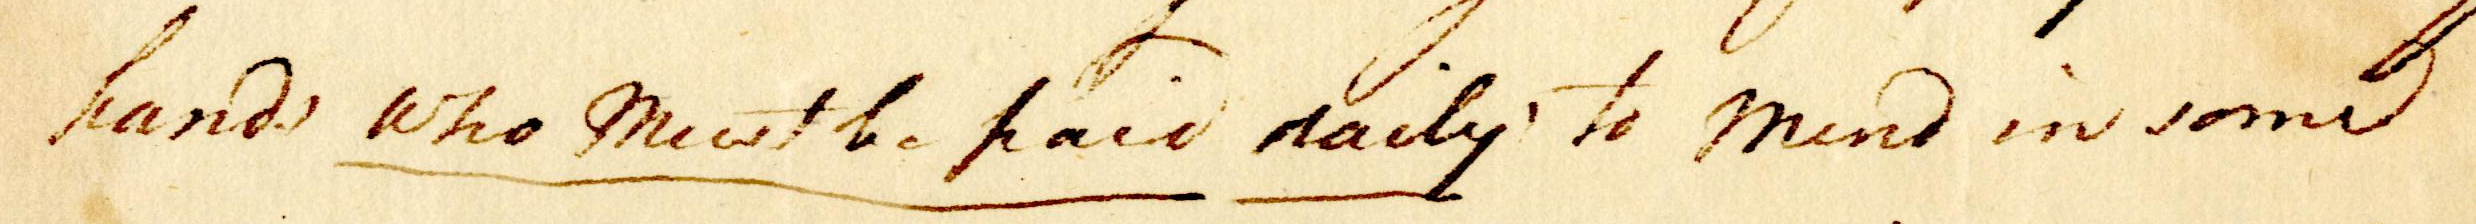hands who Must be paid daily to mend in some
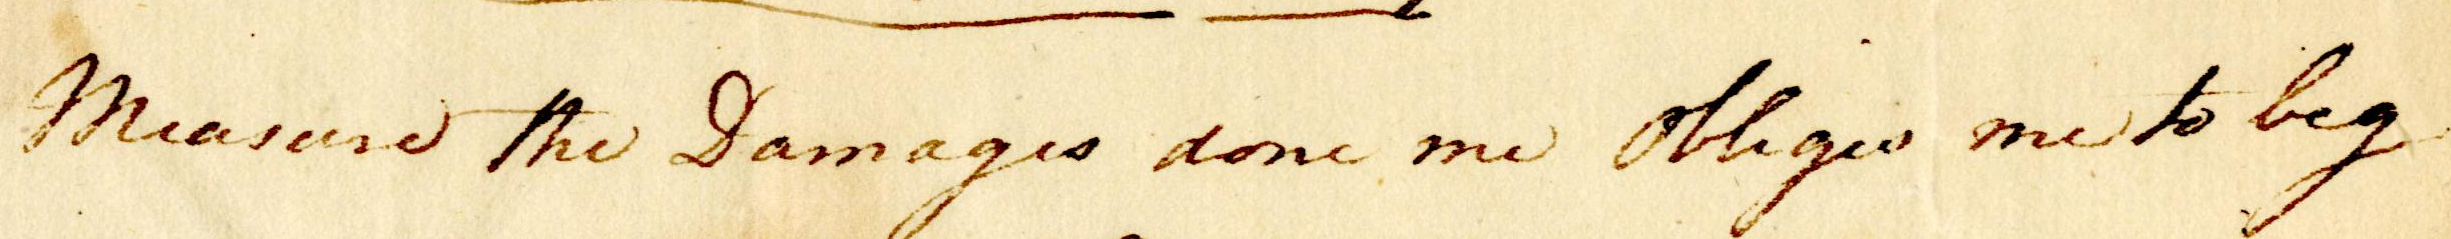Measure the Damages done me obliges me to beg
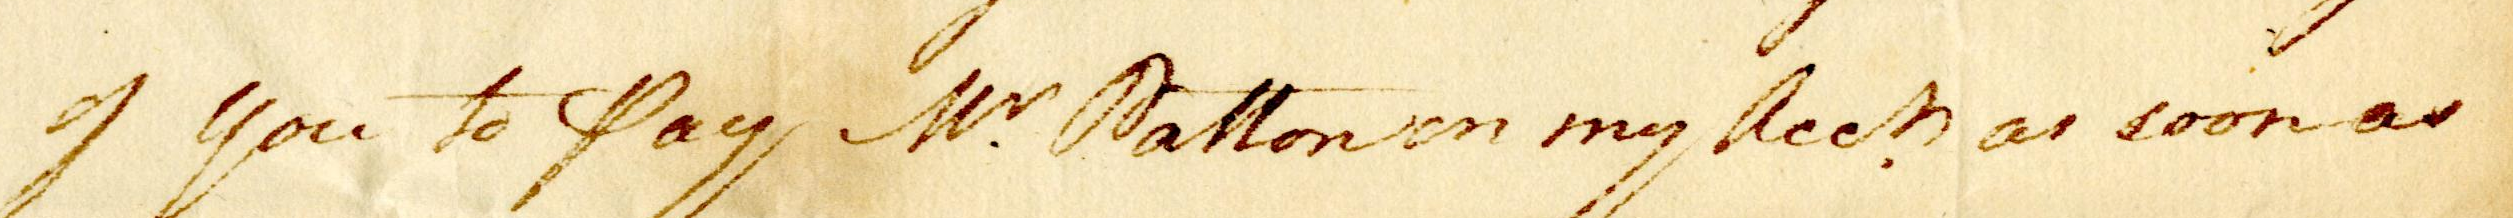of You to Pay M^r Patton on my Acco^t. as soon as
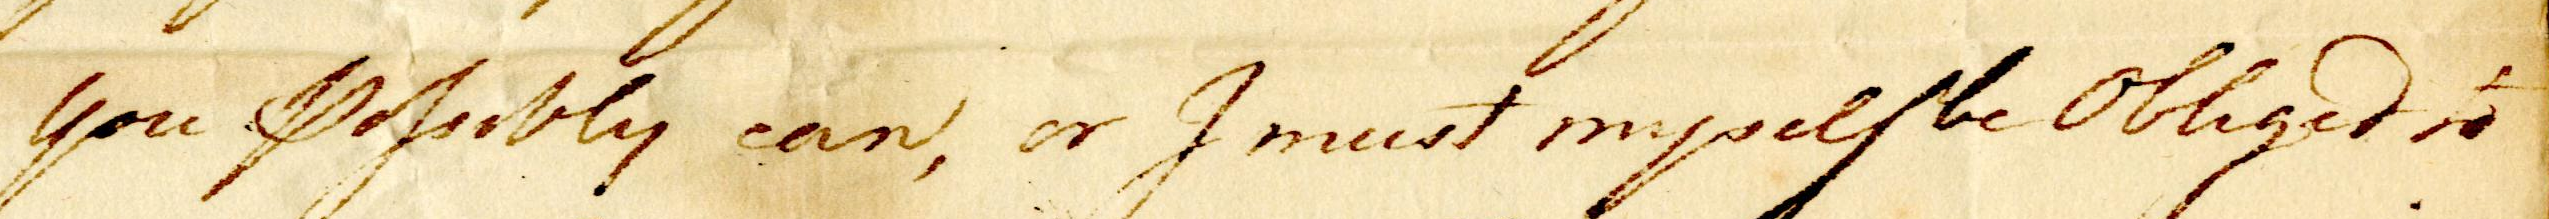You Possibly can, or I must myself be obliged to
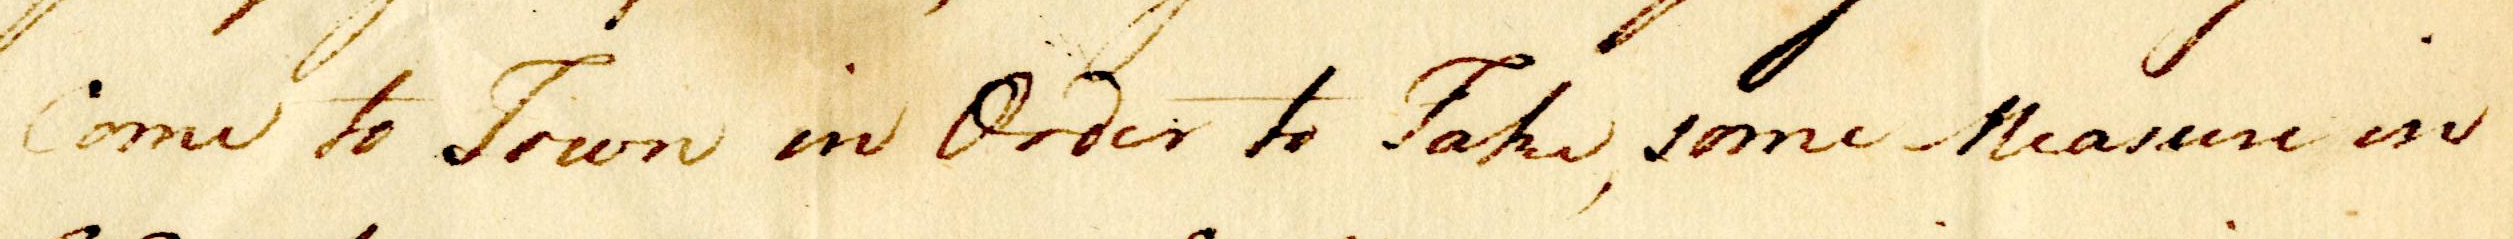come to Town in Order to Take some Measure in
